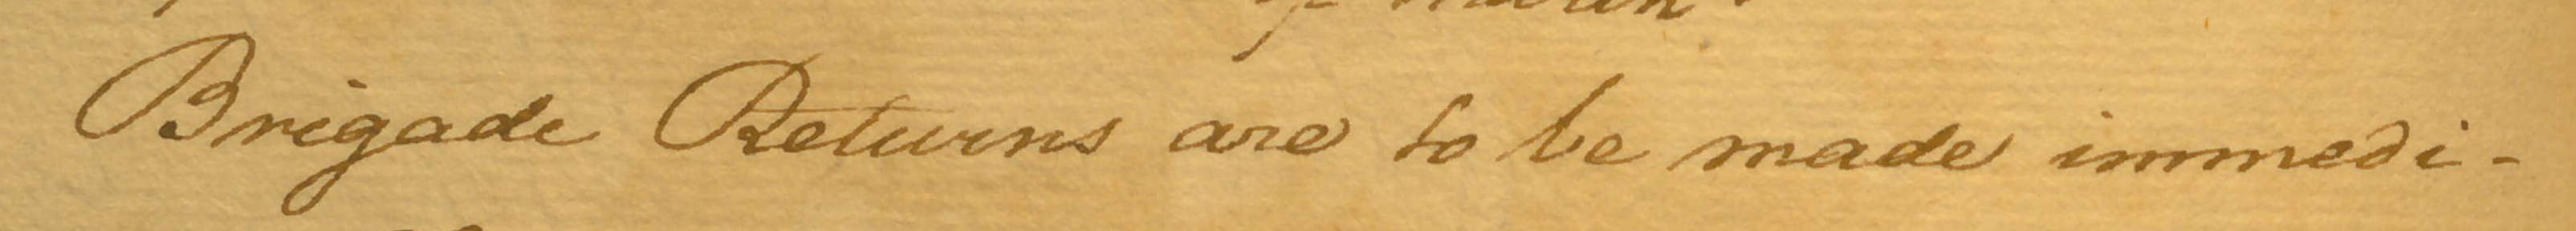Brigade Returns are to be made immedi-
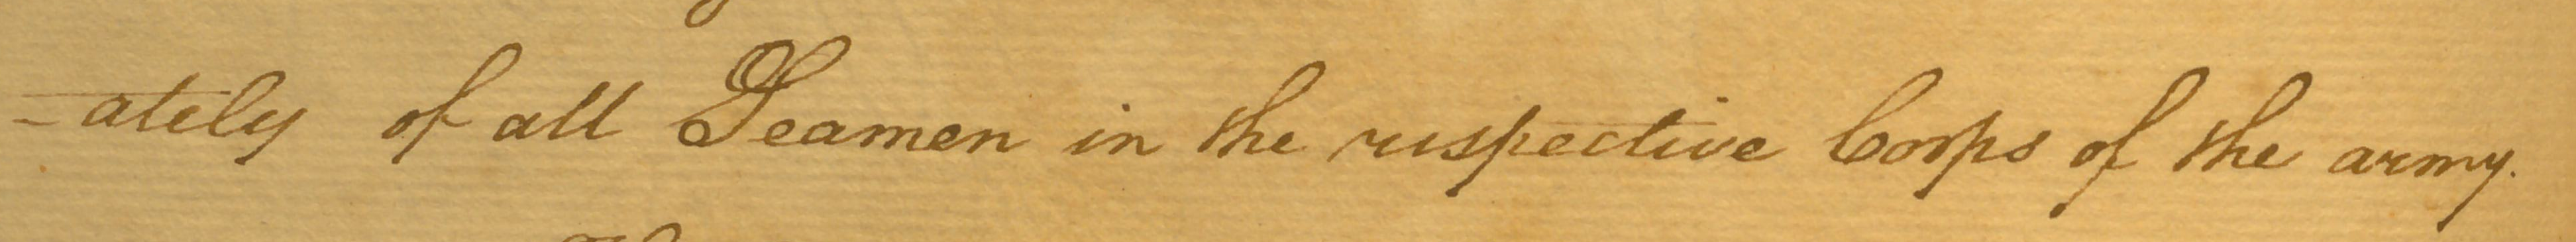-ately of all Seamen in the respective Corps of the army.
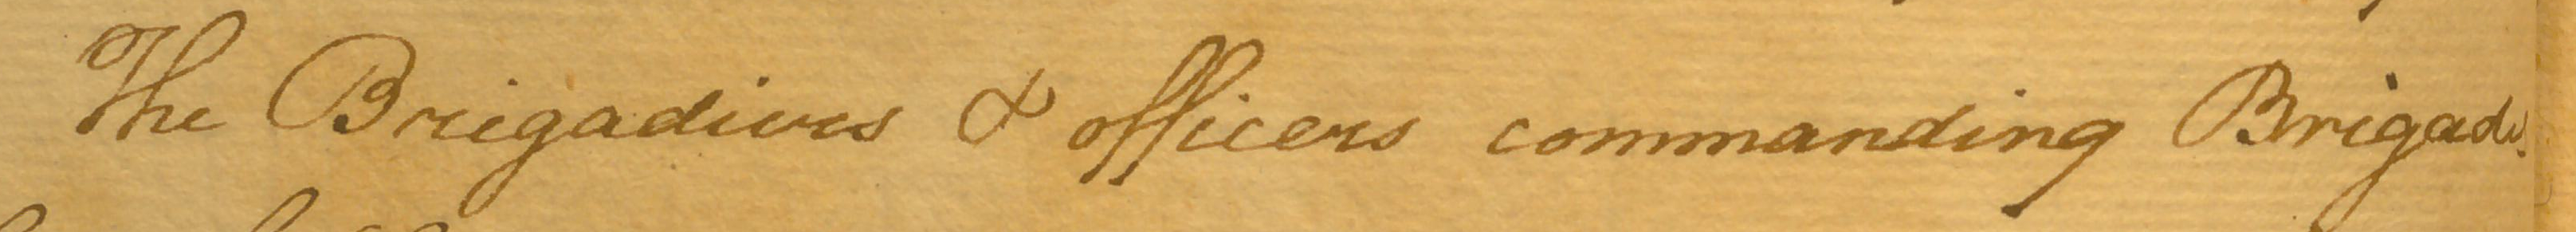The Brigadiers & officers commanding Brigades
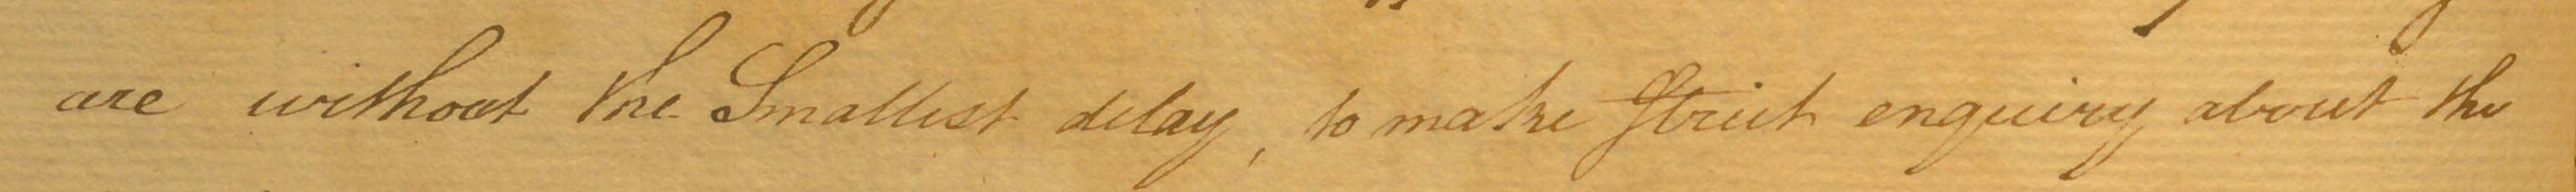are without the Smallest delay, to make strict enquiry about the
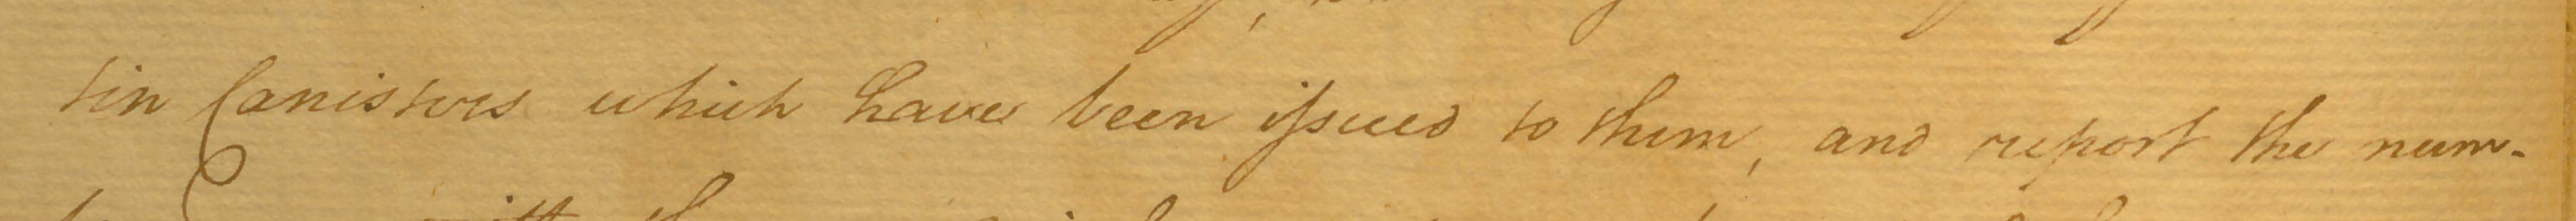tin Canisters which have been issued to them, and report the num-
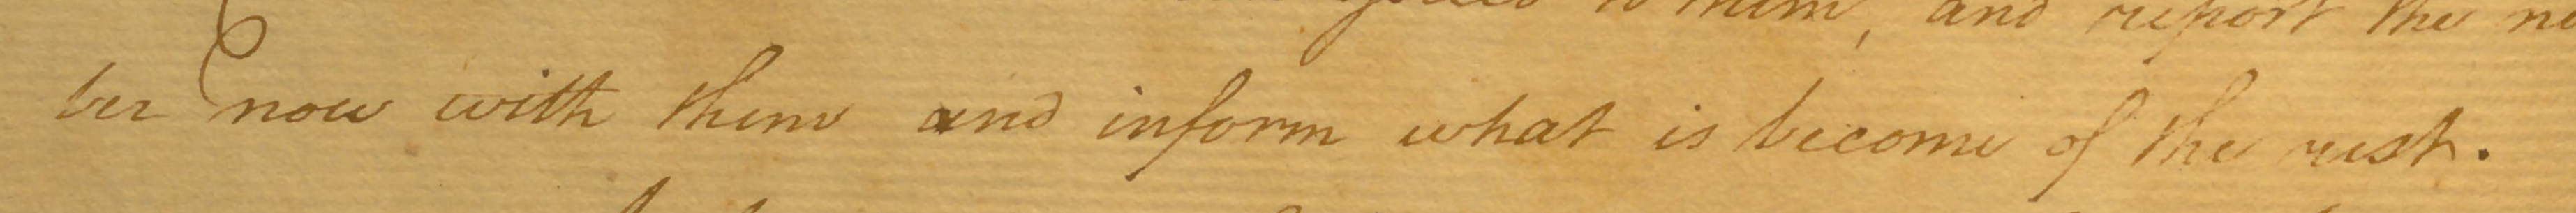ber now with them and inform what is become of the rest.
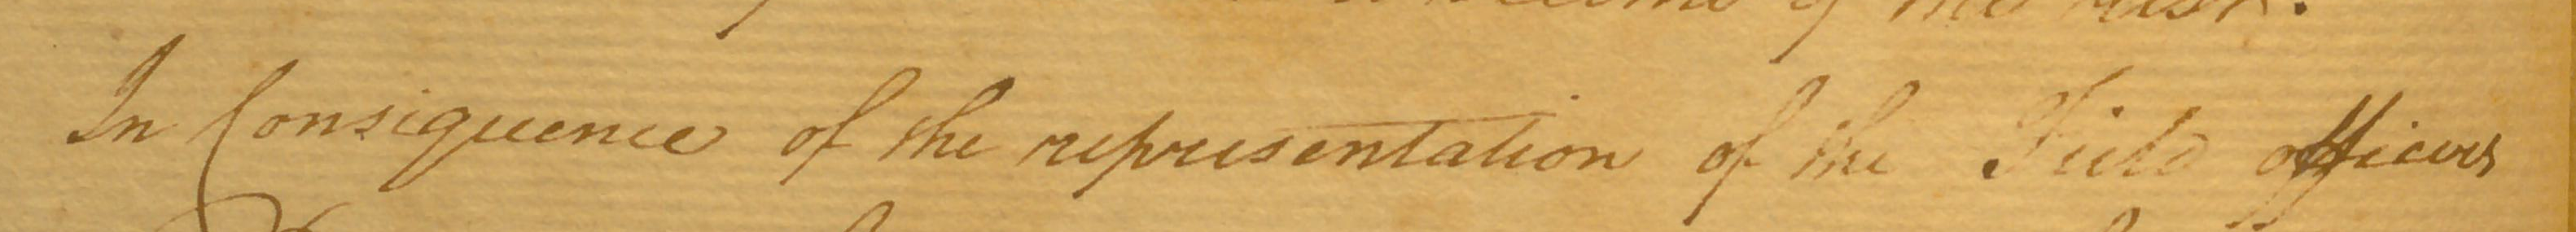In Consiquence of the representation of the Field officers
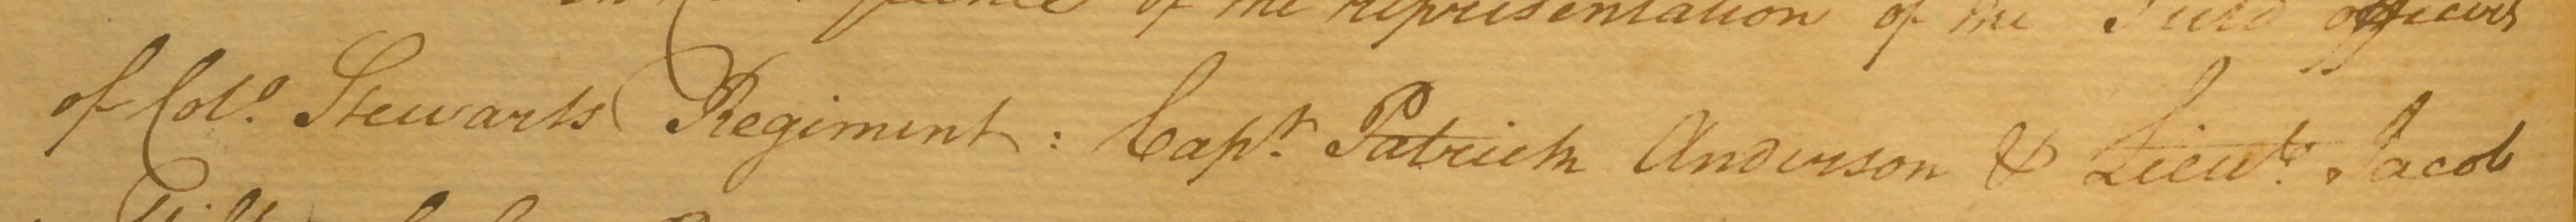of Col^o. Stewarts Regiment: Cap^t. Patrick Anderson & Lieu^t. Jacob
